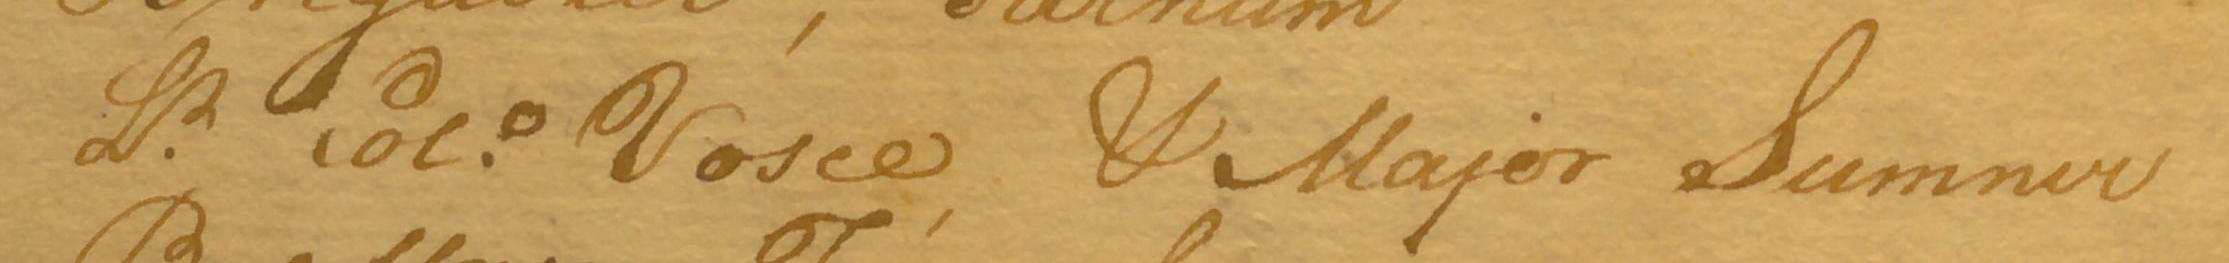L^t. Col^o. Vosce & Major Sumner
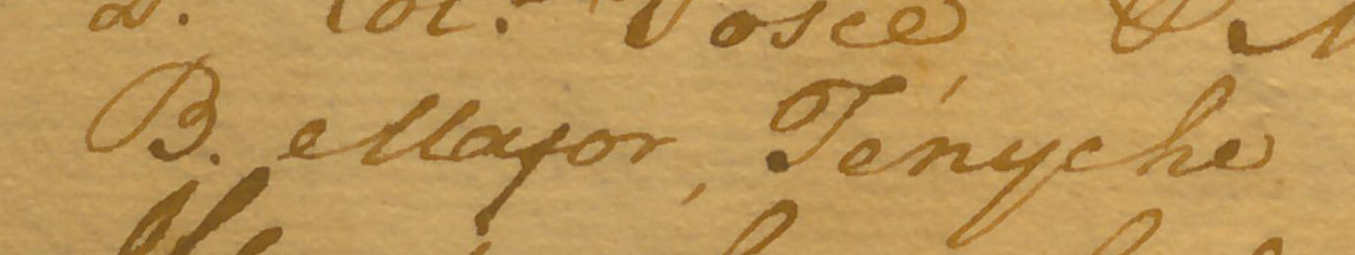B. Major Tenyche
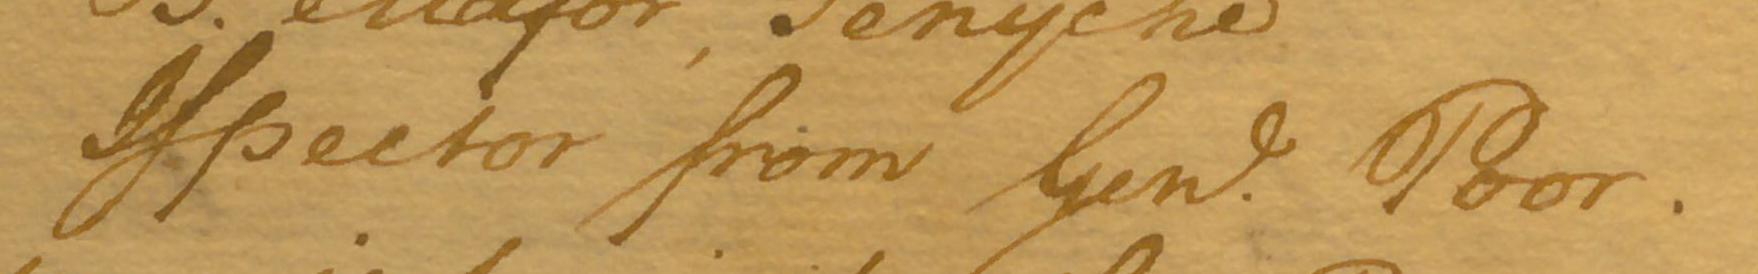Ispector from Gen^l. Poor.
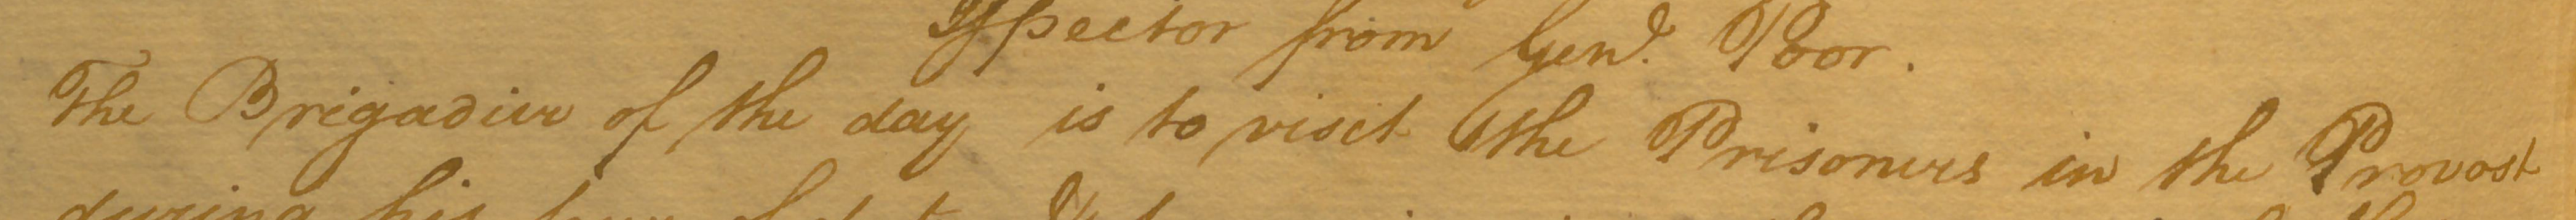The Brigadier of the day is to visit the Prisoners in the Provost
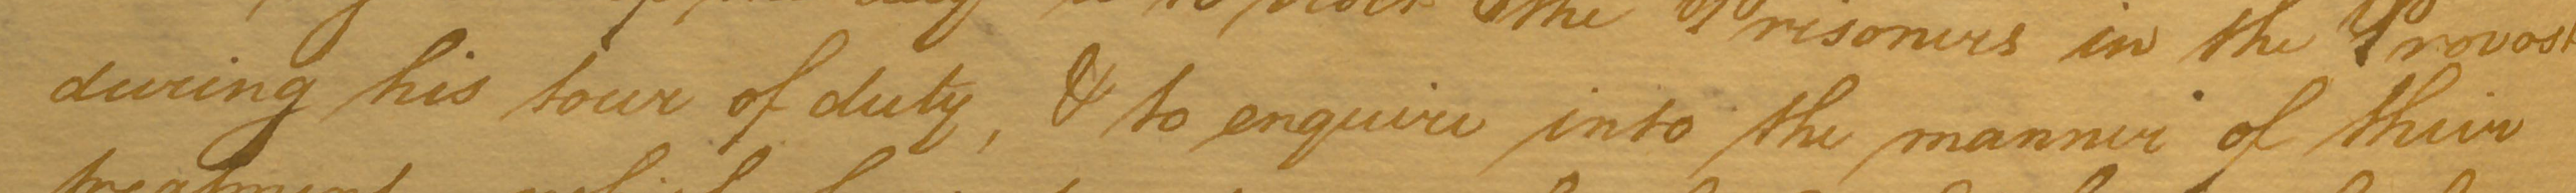during his tour of duty, & to enquire into the manner of their
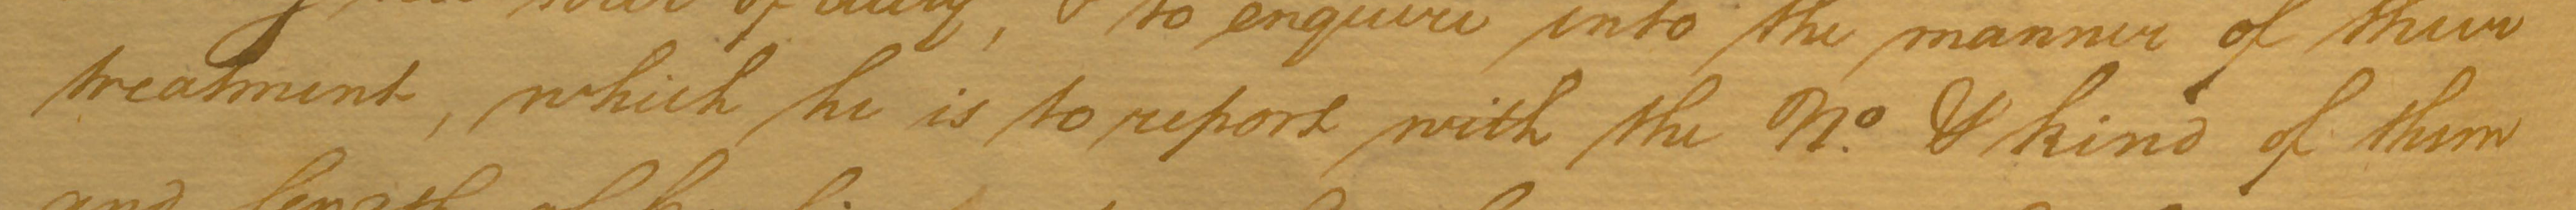treatment, which he is to report with the N^o. & kind of them
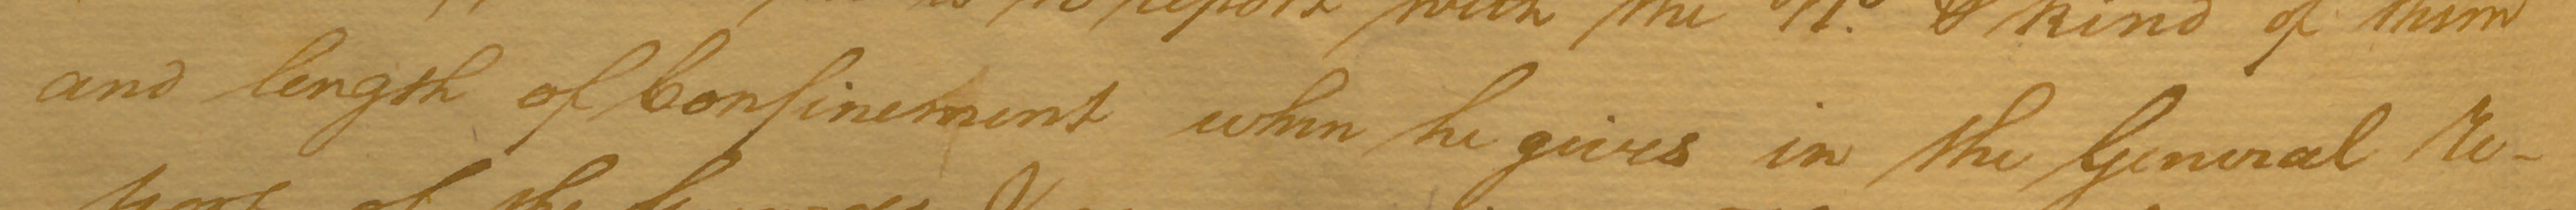and length of Confinement when he gives in the General re-
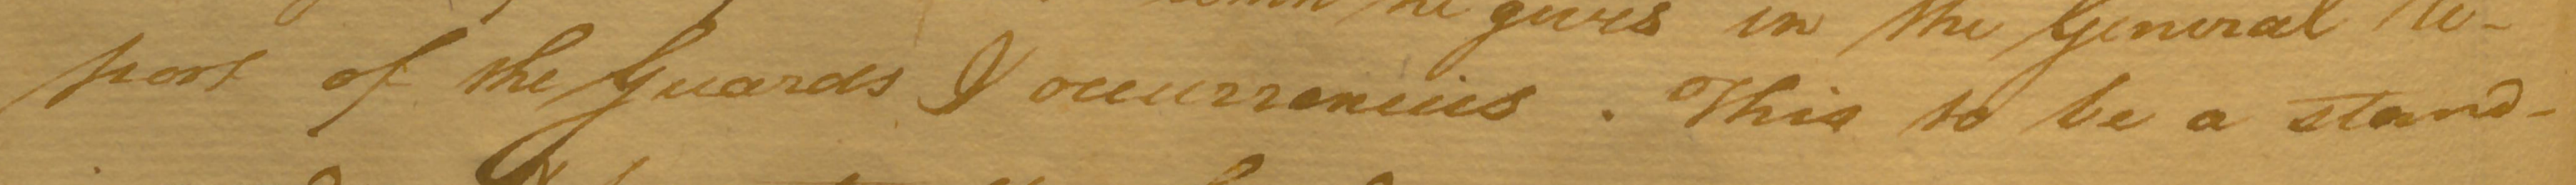port of the Guards & occurrencies. This to be a stand-
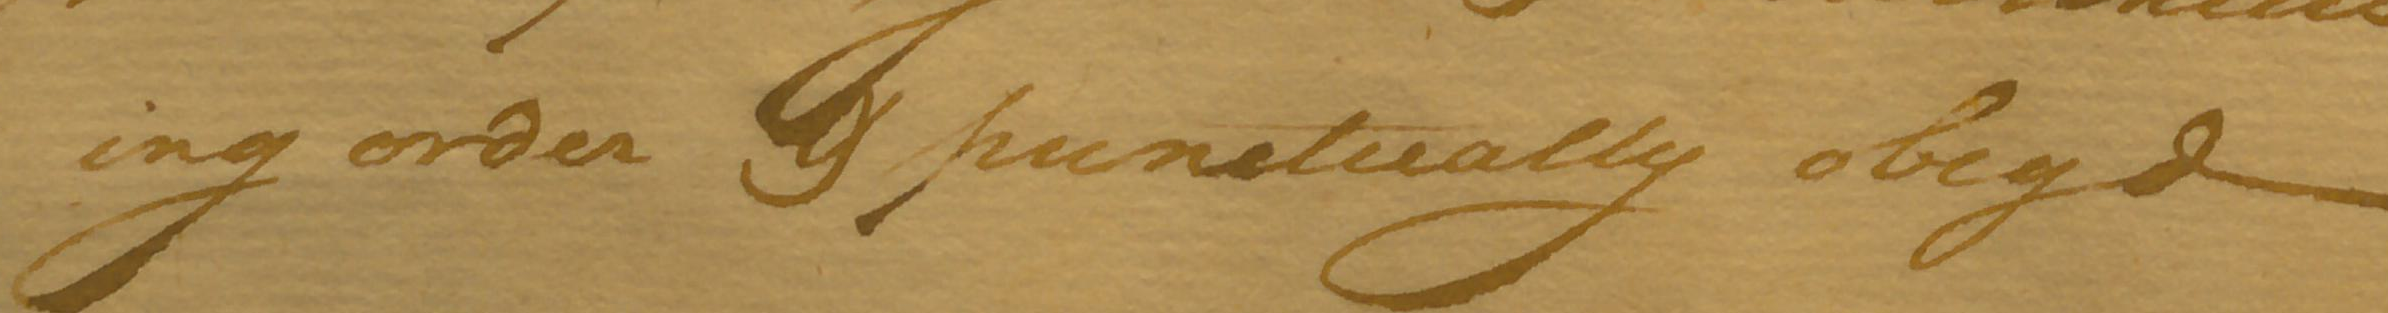ing order & punctually obeyd
